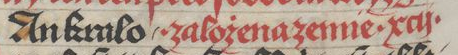An kralo.zalożena zemie.xcij.
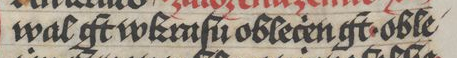wal ḡt wkraſu obleċen ḡt.oble¬
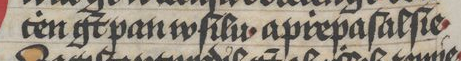ċen ḡt pan wſilu.a pṙepaſal ſie.
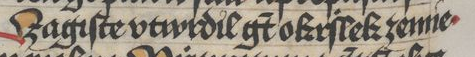Zagiſte vtwrdil ḡt okrẛlek zemie.
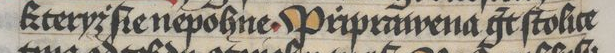kteryż ſie nepohne.Pṙiprawena ḡt ſtolice
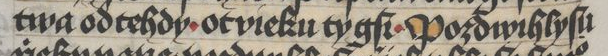twa odtehdy.ot vieku ty gſi.Pozdwihlyſu
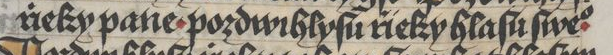ṙieky pane.pozdwihlyſu ṙieky hlaſu ſweo.
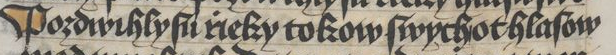Pozdwihly ſu ṙieky tokow ſwychot hlaſow
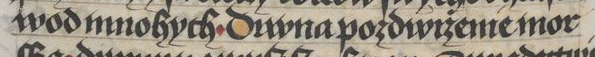wod mnohych.Diwna pozdwiżenie mor¬
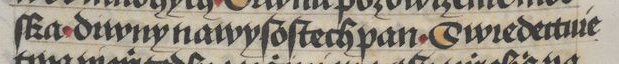ſka.diwny na wyſoſtech pan.Swiedectuie
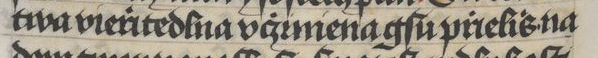twa vieṙitedlna vcżiníena gſu pṙieliṡ na
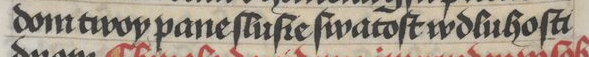dom twoy pane ſluſie ſwatoſt wdluhoſti
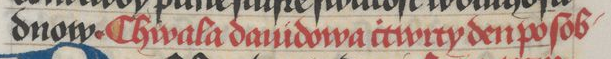dnow.Chwala davidowa ċtwrty den poſob
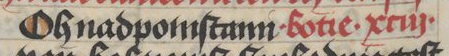Oh nadpomſtami.botie.xciij.
